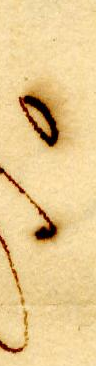To
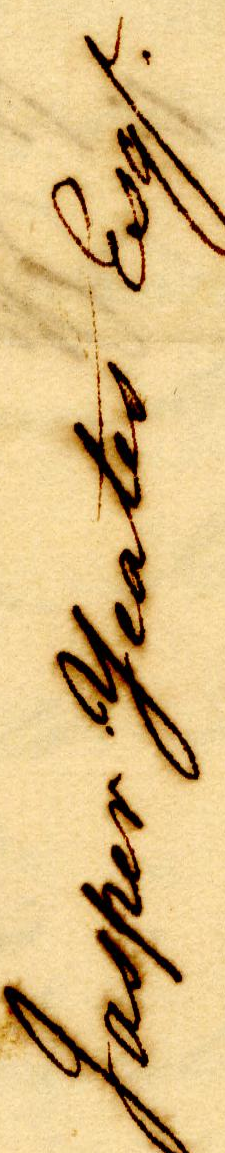Jasper Yeates Esq^r.
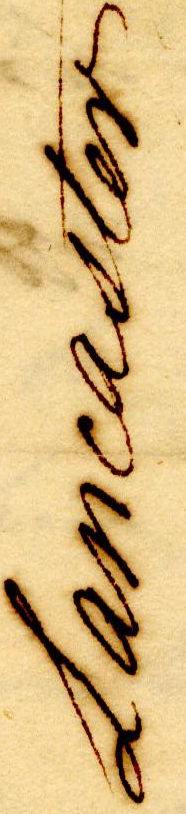Lancaster
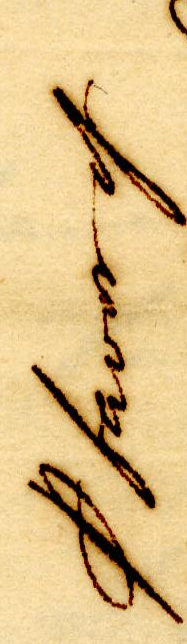Per favor of
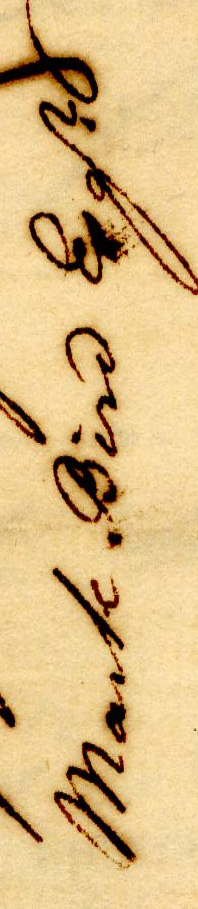Mark Bird Esq^r
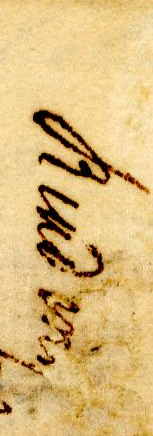Reading
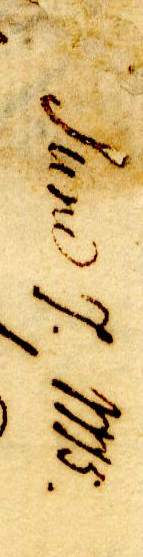June 7. 1775.
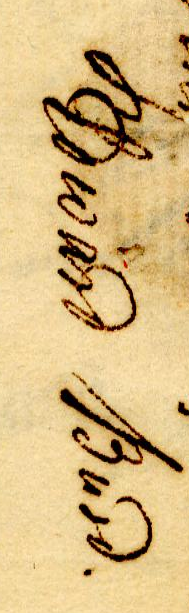Edward Burd.
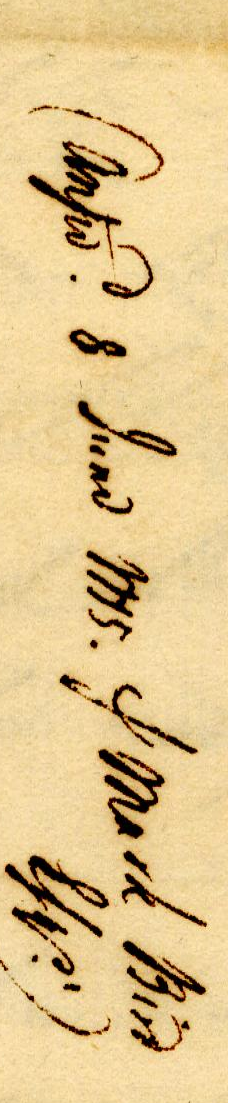(Answ^d. 8 June 1775. Per Mark Bird
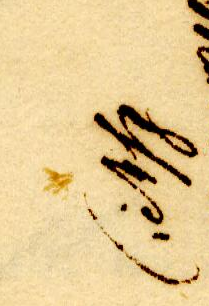Esq^r)
